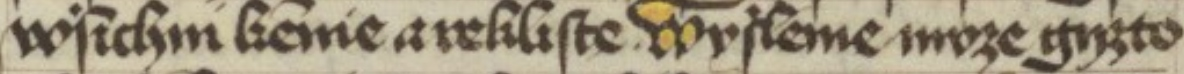wẛichni kȇnie a rekliſte Wyẛleme mvze gijzto
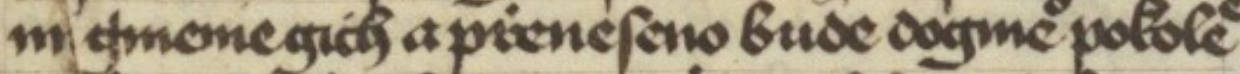mi gmenie gich a pṙeneſeno bude dogme° pokolee
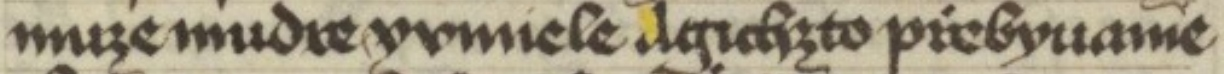muze mudre yvmiele Agichzto pṙebyuanie
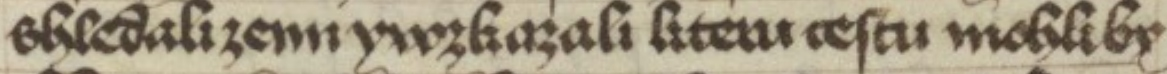shledali zemi ywzkazali kteru ceſtu mohliby
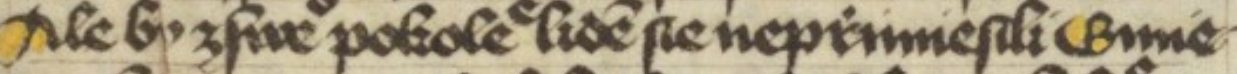Ale by zſwe° pokolee lidȇ ſie nepṙimieſili Gmie-
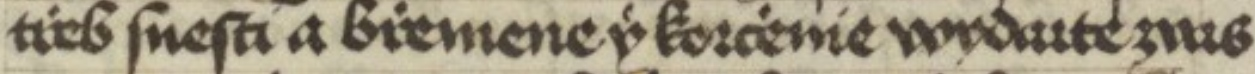tṙeb ſneſti a bṙemene ẏ korċenie wydaite zwas
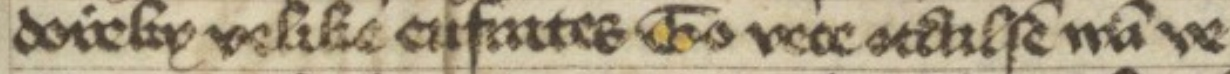doṙeky velika eufrates To vece otdalſȇ wȃ ve-
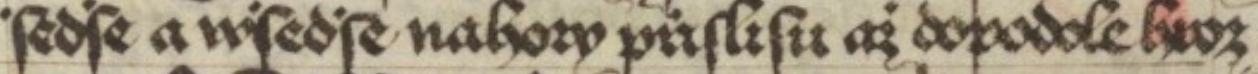ẛedẛe a wẛedẛe nahory pṙiſliſu aż dopodole hroz
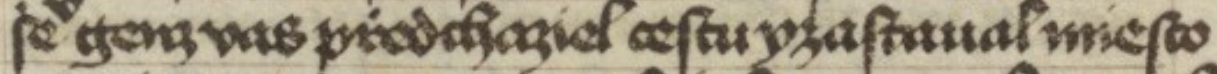ẛev genz vas pṙedchaziel ceſtu yzaſtaual mieſto
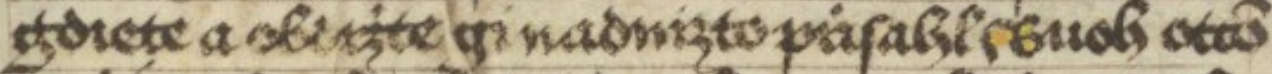gdiete a obdrżte gi nadnizto pṙiſahl Buoh otcȏ
